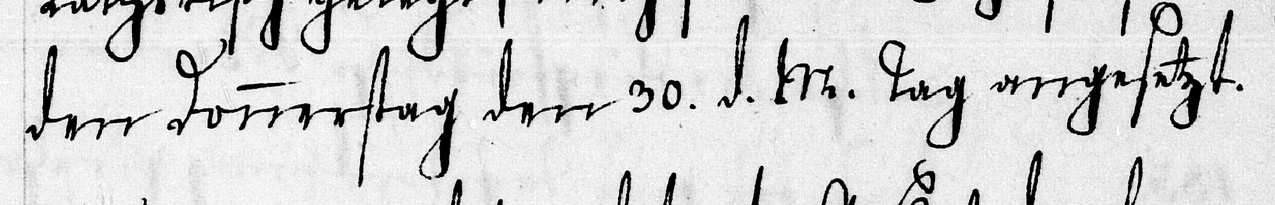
den Donnerstag den 30. d. M. Tag angesetzt.
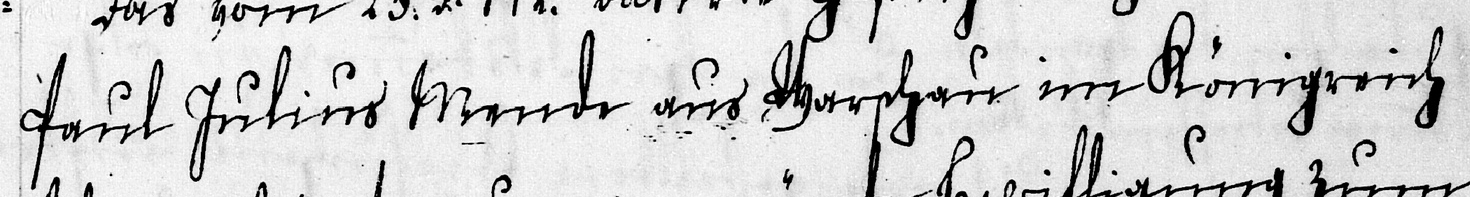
Paul Julius Mende aus Warschau im Königreich
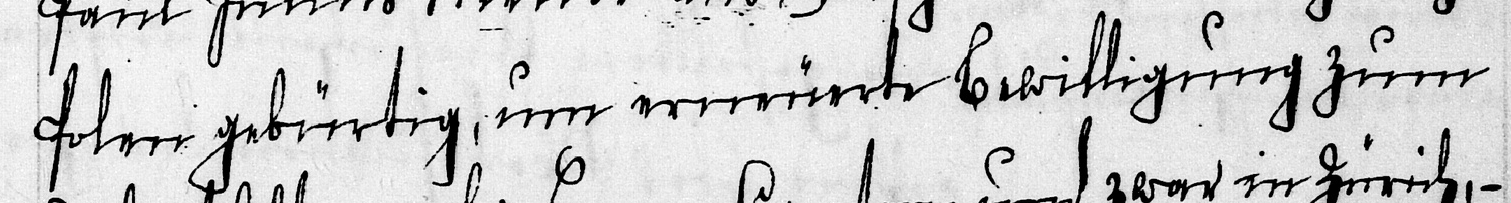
Polen gebürtig, um erneuerte Bewilligung zum
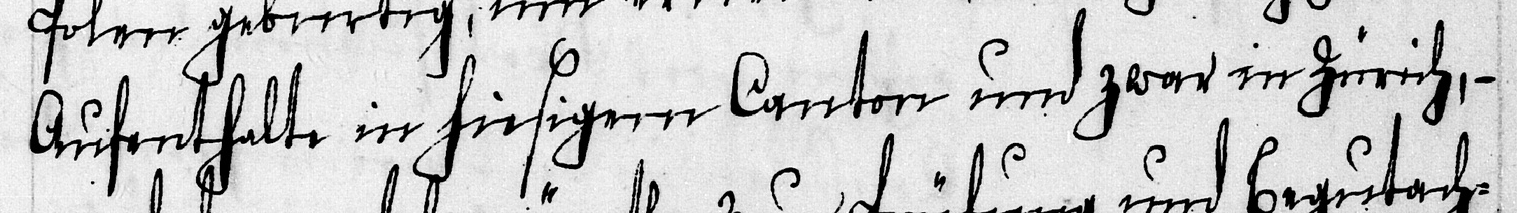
Aufenthalte in hiesigem Canton und zwar in Zürich, –
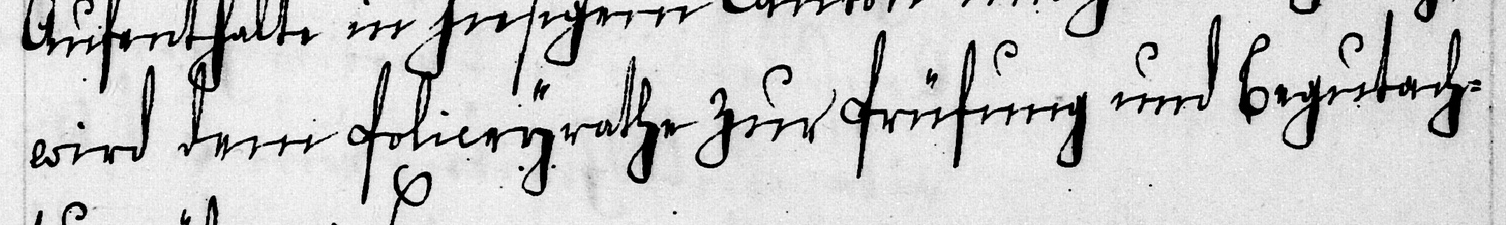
wird dem Policeyrathe zur Prüfung und Begutach¬
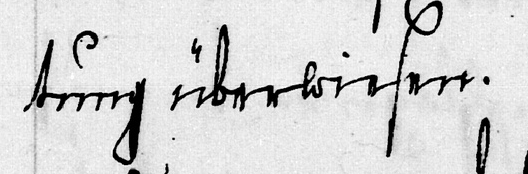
tung überwiesen.
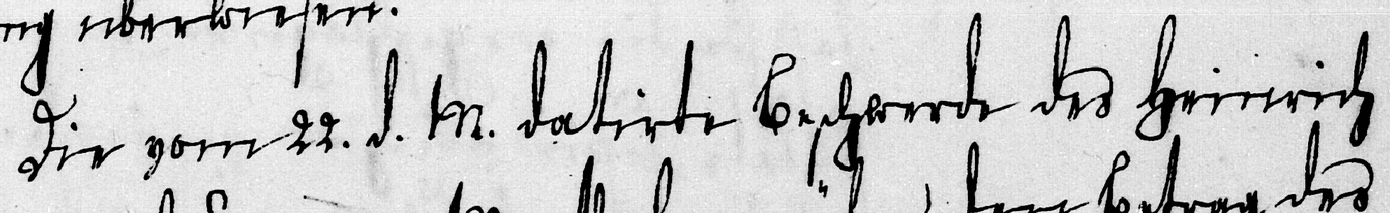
Die vom 22. d. M. datirte Beschwerde des Heinrich
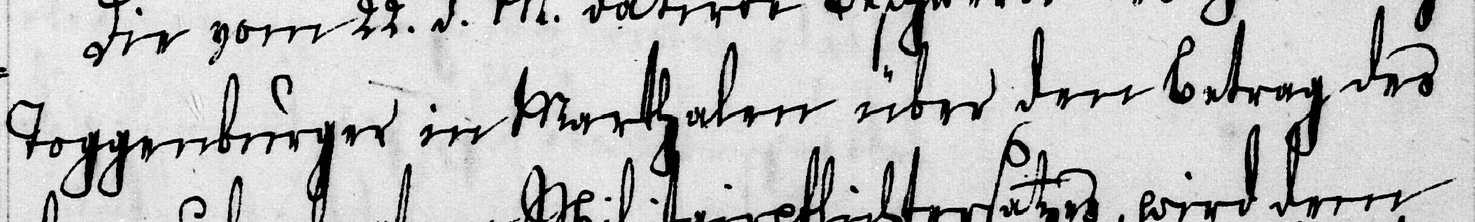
Toggenburger in Marthalen über den Betrag des
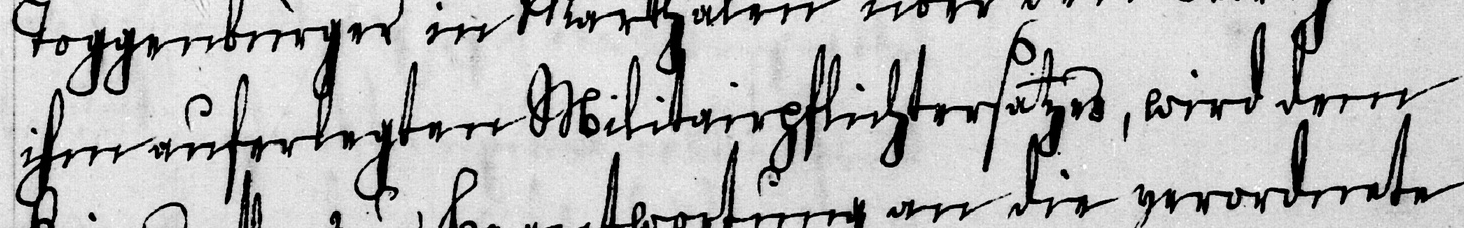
ihm auferlegten Militairpflichtersatzes, wird dem
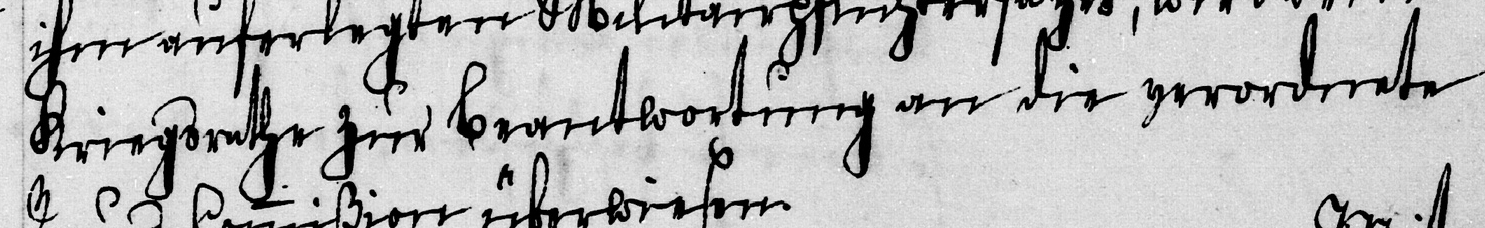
Kriegsrathe zur Beantwortung an die verordnete
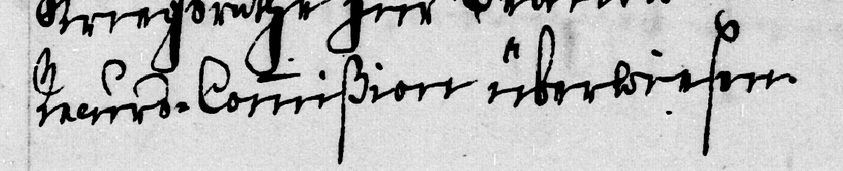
Recurs-Commißion überwiesen.
